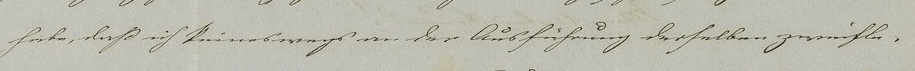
habe, daß ich keineswegs an der Ausführung derselben zweifle.
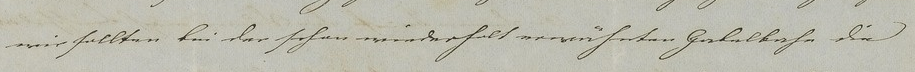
wir sollten bei der schon wiederholt erwähnten Gabelbahn die
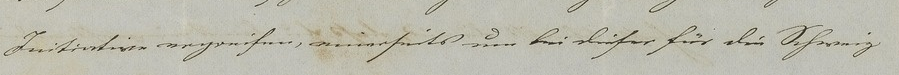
Initiative ergreifen, einerseits um bei dieser für die Schweiz
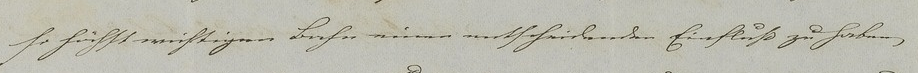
so höchst wichtigen Bahn einen entscheidenden Einfluß zu haben,
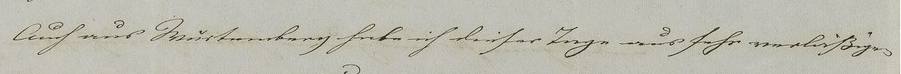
Auch aus Würtemberg habe ich dieser Tage aus sehr verläßiger
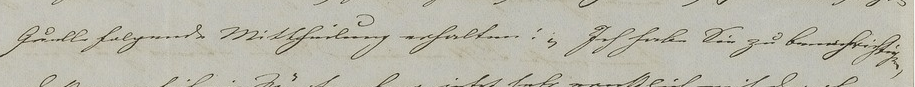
Quelle folgende Mittheilung erhalten: «Ich habe Sie zu benachrichtigen,
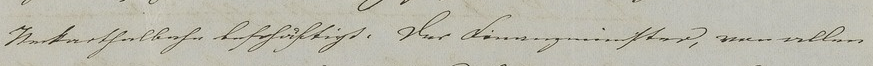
Neckarthalbahn beschäftigt. Der Finanzminister, von allen
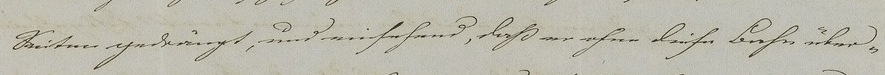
Seiten gedrängt, und einsehend, daß er ohne diese Bahn über-
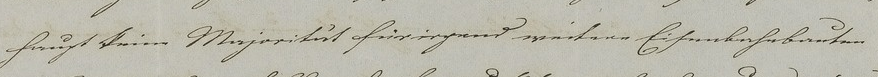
haupt keine Majorität für irgend weitere Eisenbahnbauten
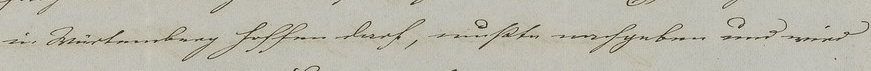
in Würtemberg hoffen darf, mußte nachgeben und wird
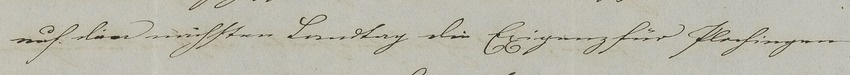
auf den nächsten Landtag die Exigenz für Plochingen–
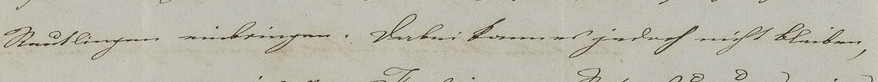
Reutlingen einbringen. Dabei kann es jedoch nicht bleiben,
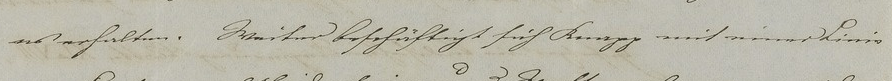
es erhalten. Weiter beschäftigt sich Knapp mit einer Linie
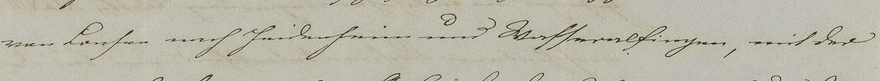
von Lonsee nach Heidenheim und Wasseralfingen, mit der
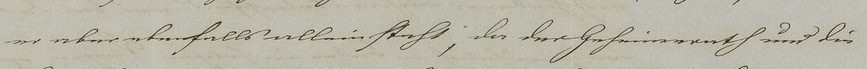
er aber ebenfalls allein steht, da der Geheimrath und die
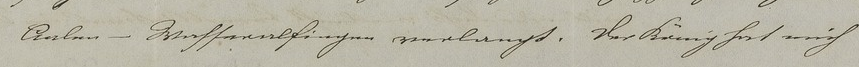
Aalen–Wasseralfingen verlangt. Der König hat mich
